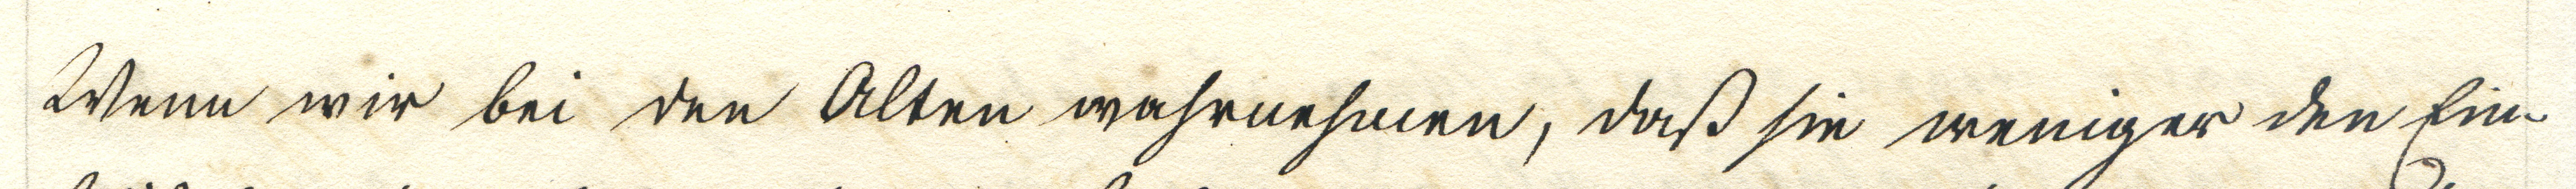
Wenn wir bei den Alten wahrnehmen, daß sie weniger den Ein-
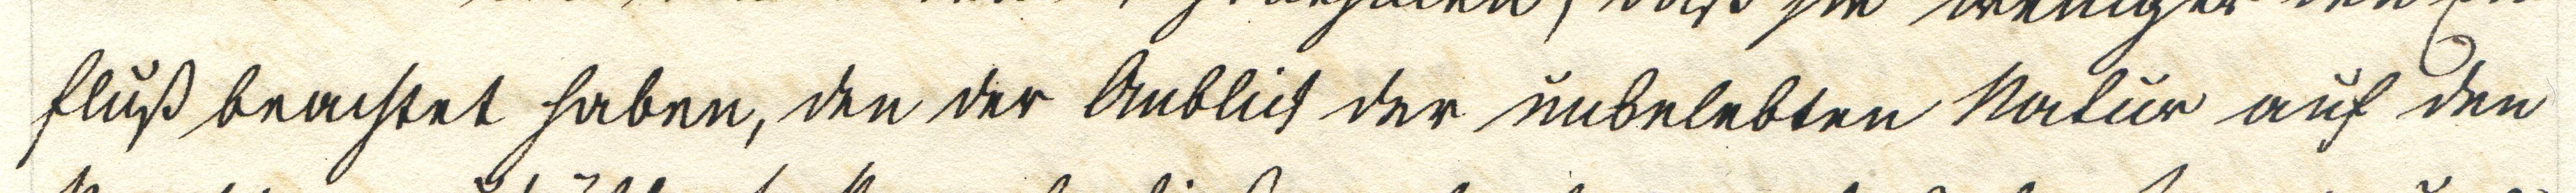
fluß beachtet haben, den der Anblick der unbelebten Natur auf den
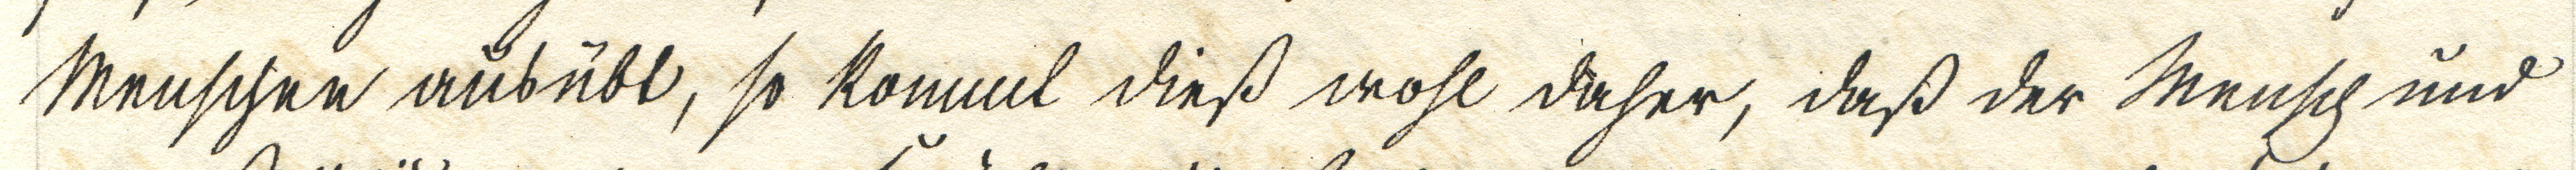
Menschen ausübt, so kommt dieß wohl daher, daß der Mensch und
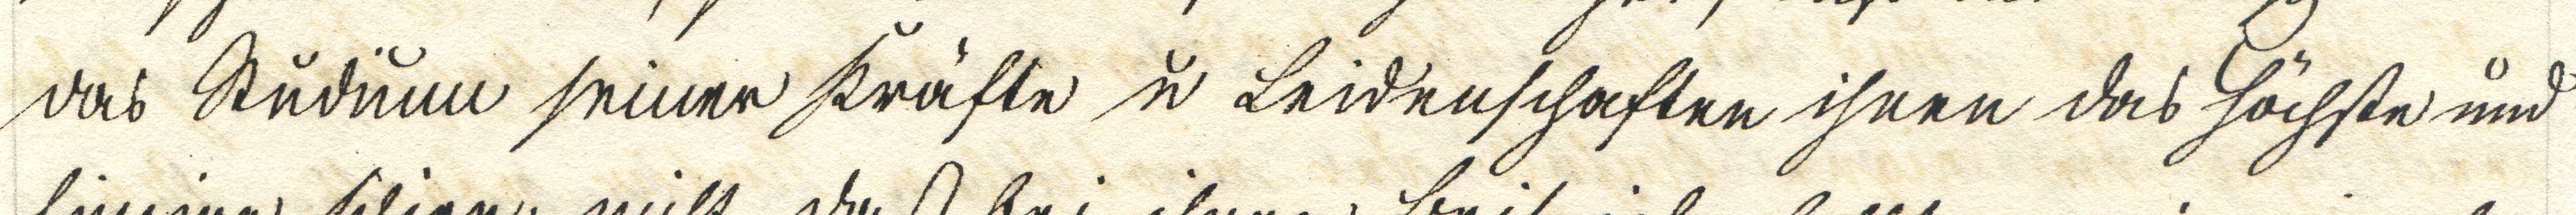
das Studium seiner Kräfte u Leidenschaften ihnen das Höchste und
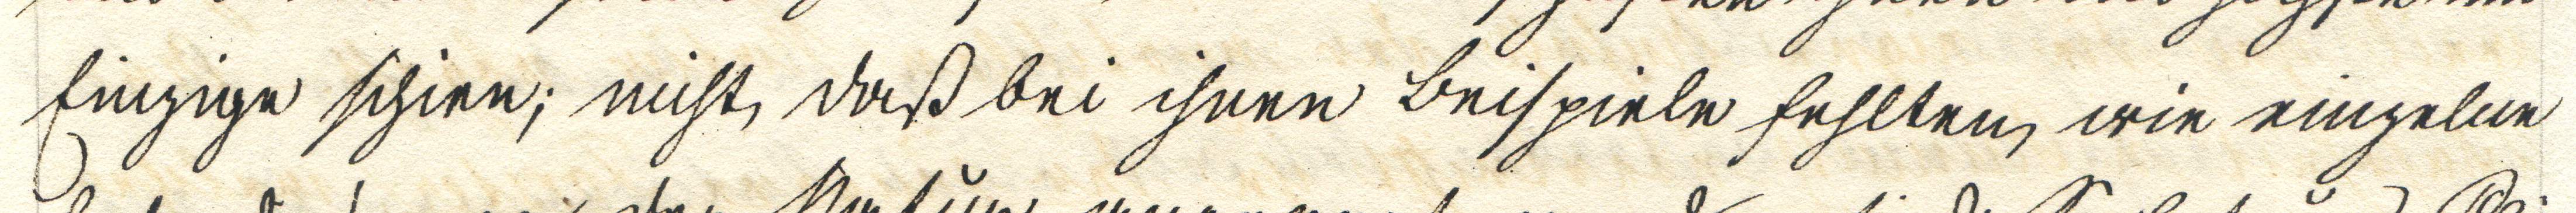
Einzige schien; nicht, daß bei ihnen Beispiele fehlten, wie einzelne
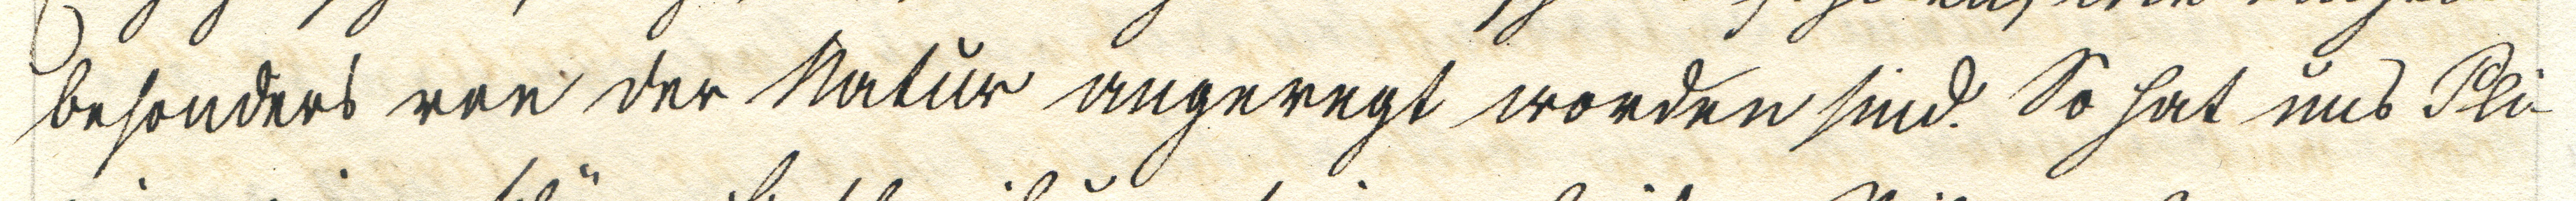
besonders von der Natur angeregt worden sind. So hat uns Pli-
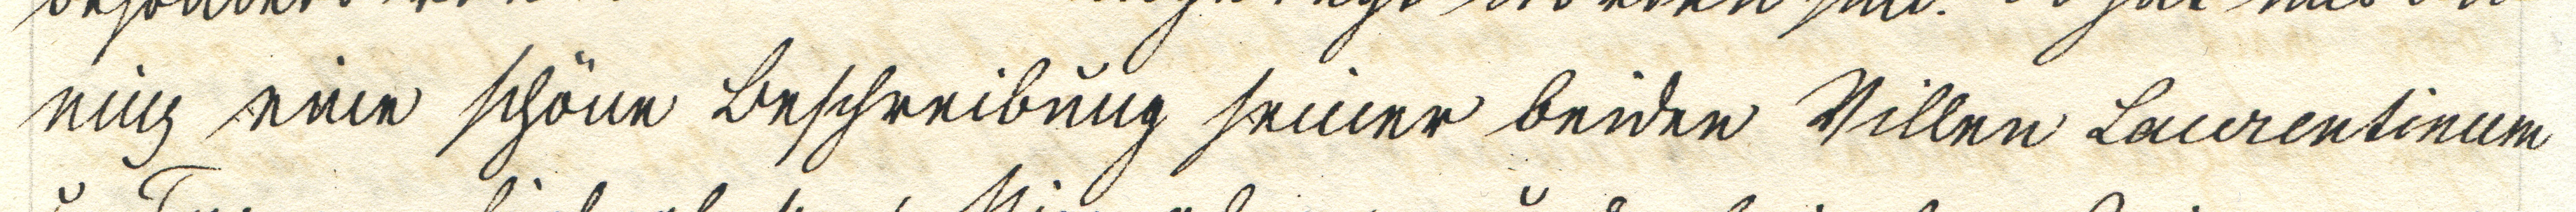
nius eine schöne Beschreibung seiner beiden Villen Laurentinum
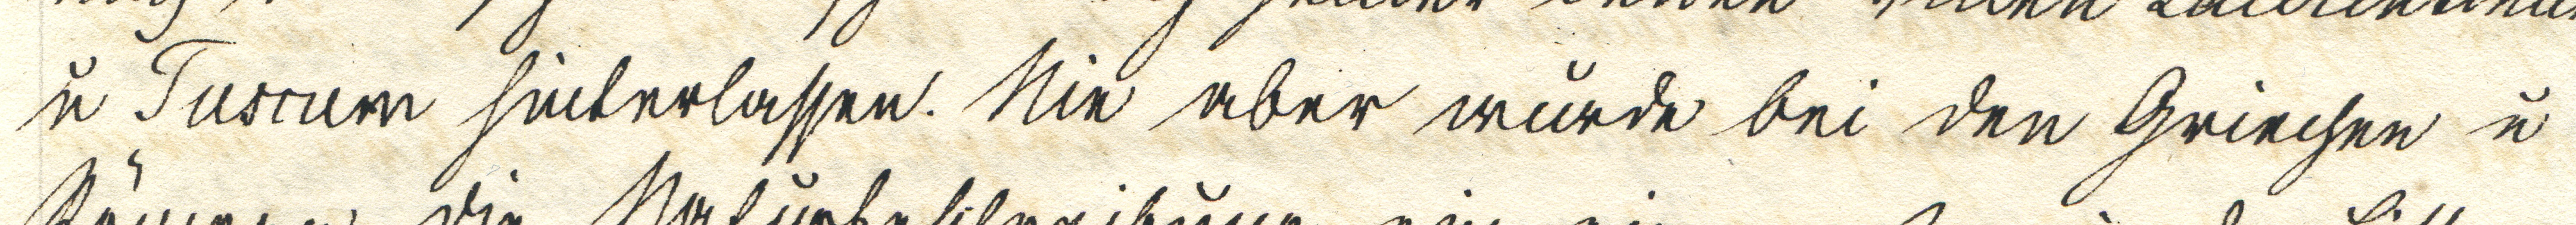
u Tuscum hinterlassen. Nie aber wurde bei den Griechen u
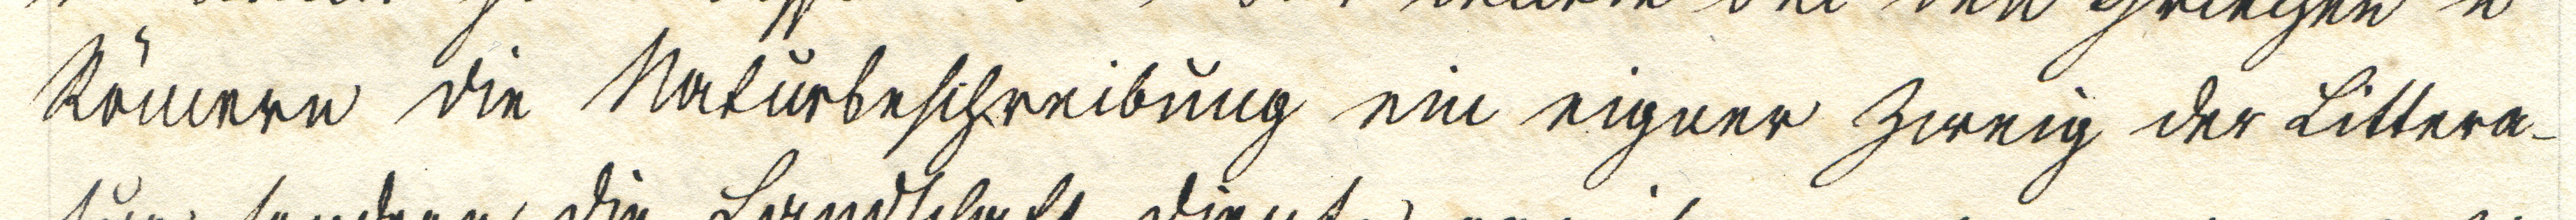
Römern die Naturbeschreibung ein eigner Zweig der Littera-
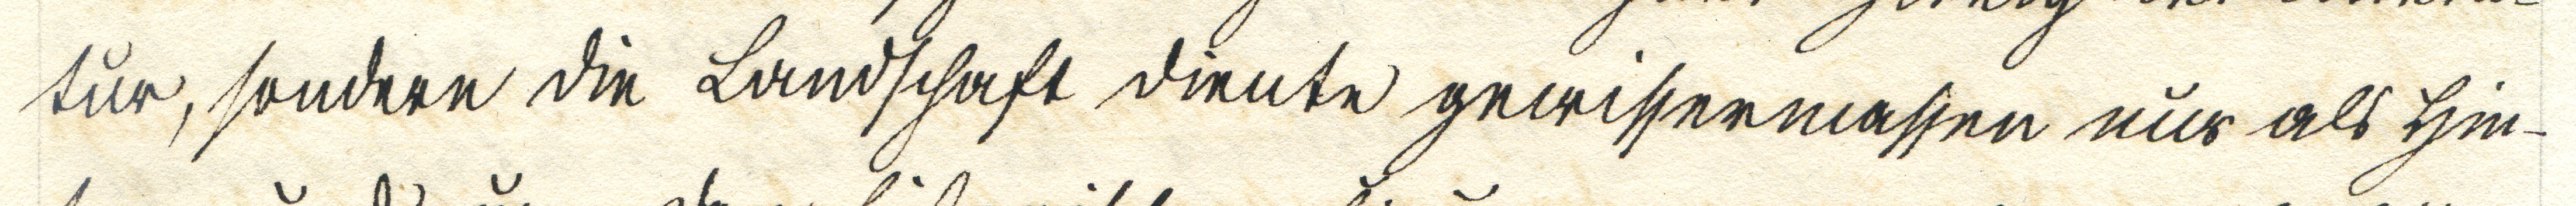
tur, sondern die Landschaft diente gewissermassen nur als Hin-
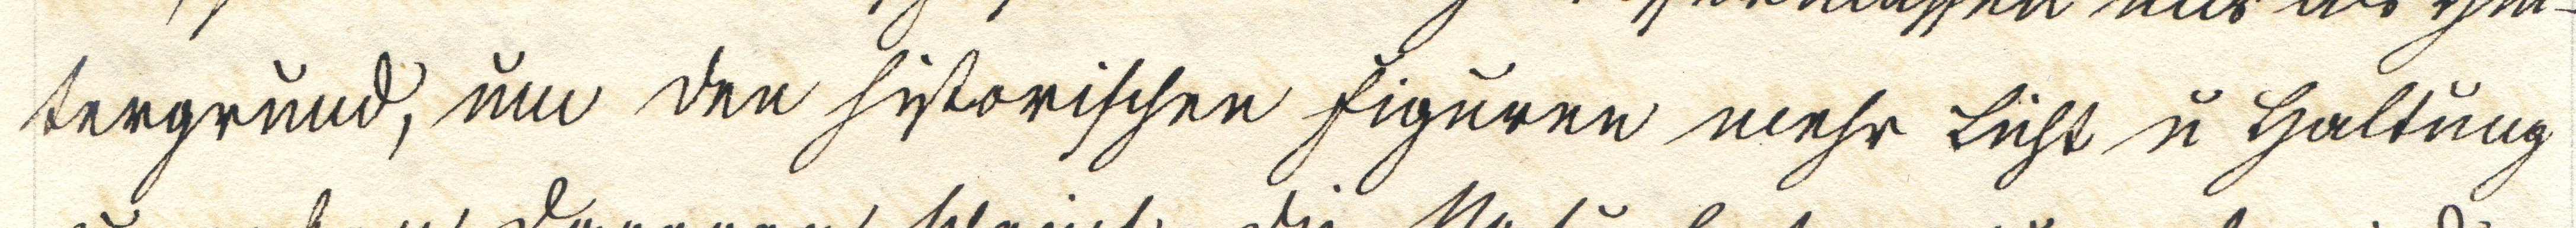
tergrund, um den historischen Figuren mehr Licht u Haltung
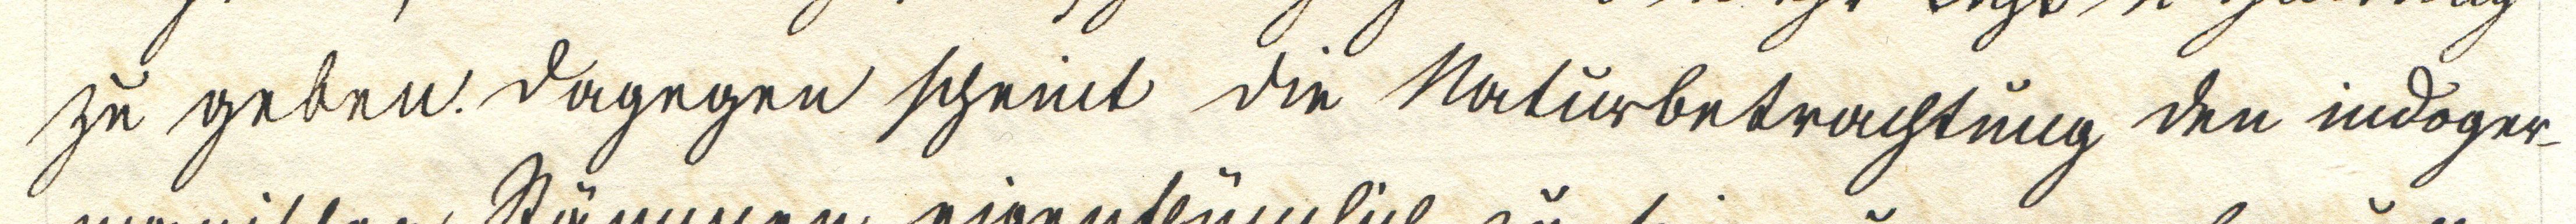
zu geben. Dagegen scheint die Naturbetrachtung den indoger-
